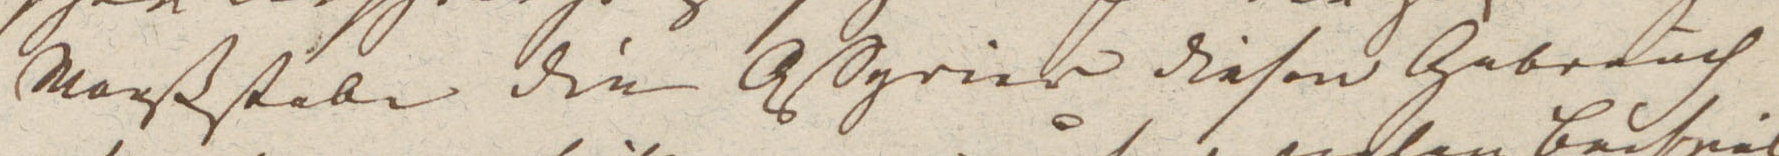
Maassstabe die Assyrier diesen Gebrauch
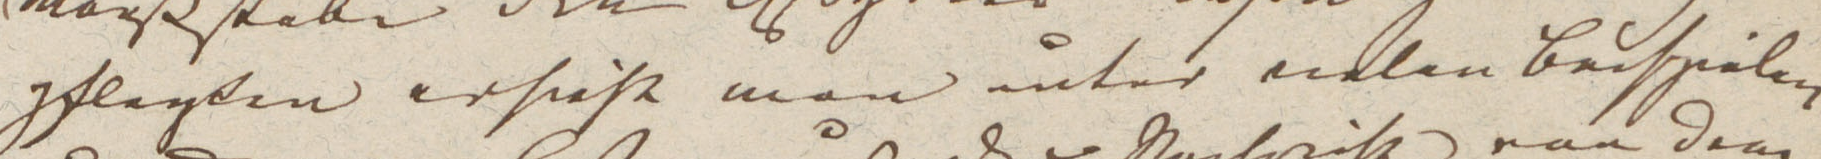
pflegten ersieht man unter vielen Beispielen
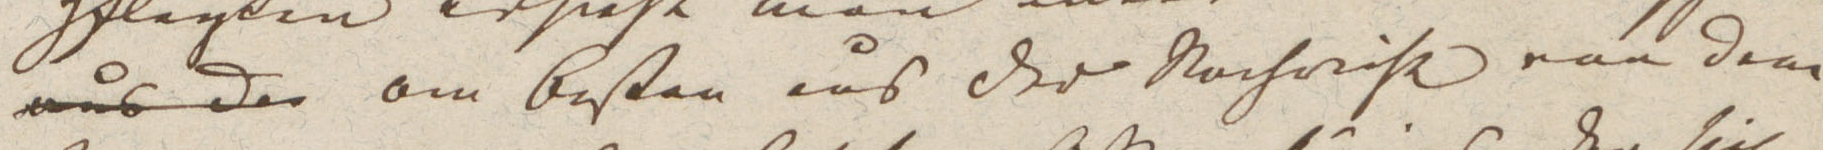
aus de am besten aus der Nachricht von dem
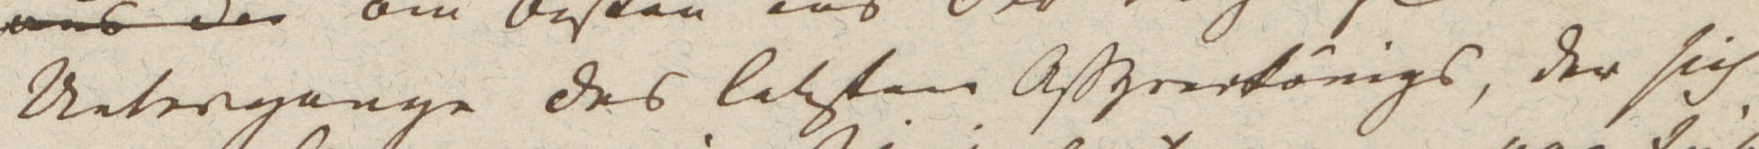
Untergange des letzten Assyrerkönigs, der sich
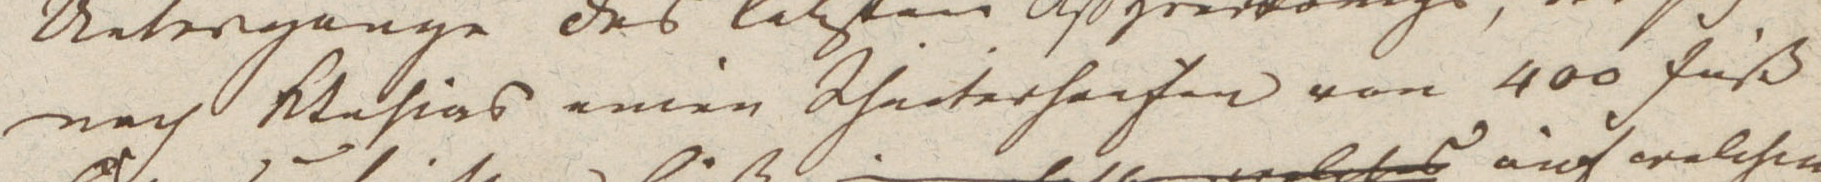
nach Ktesias einen Scheiterhaufen von 400 Fuss
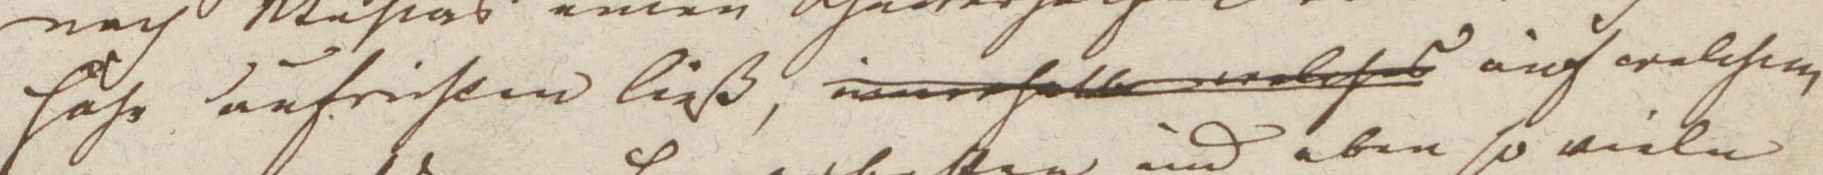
Höhe aufrichten liess, innerhalb welches auf welchem
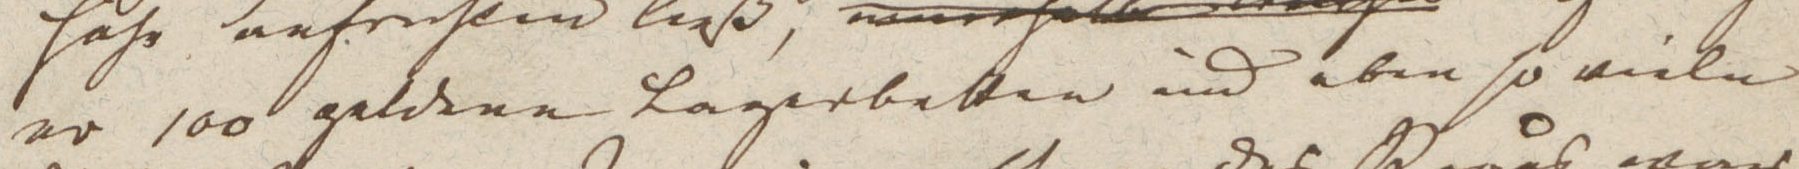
er 100 goldene Lagerbetten und eben so viele
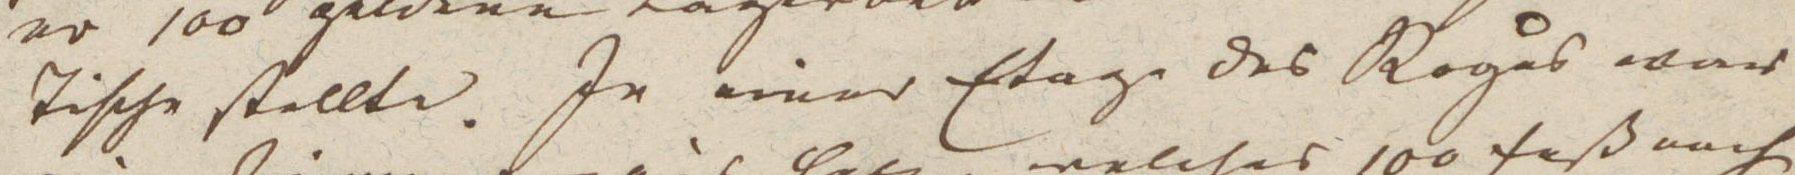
Tische stellte. In einer Etage des Rogus war
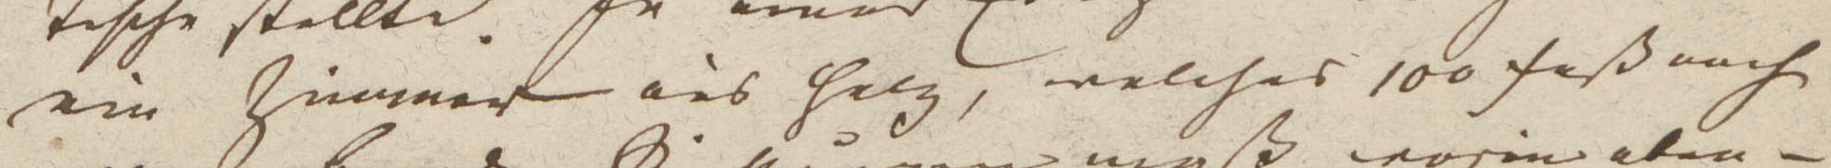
ein Zimmer aus Holz, welches 100 Fuss nach
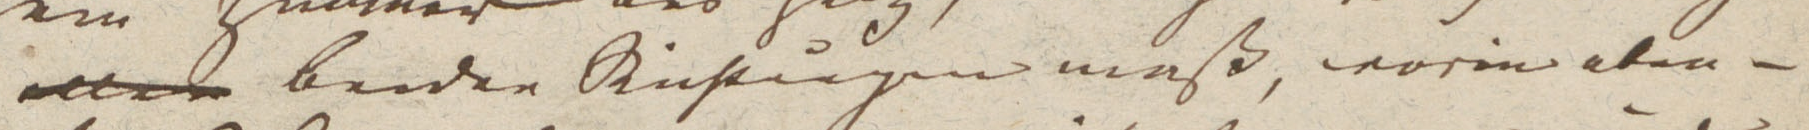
allen beiden Richtungen mass, worin eben-
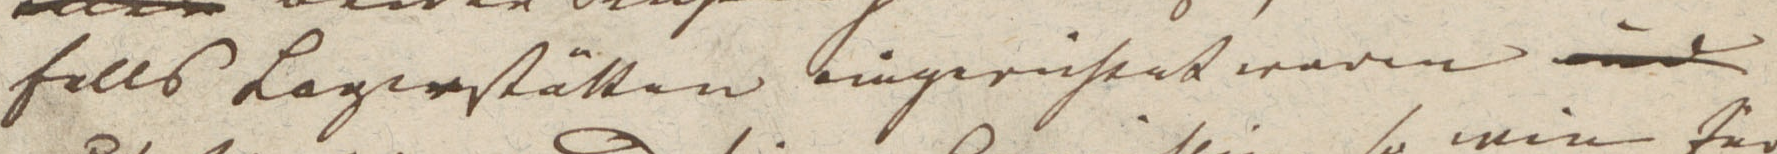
falls Lagerstätten eingerichtet waren und
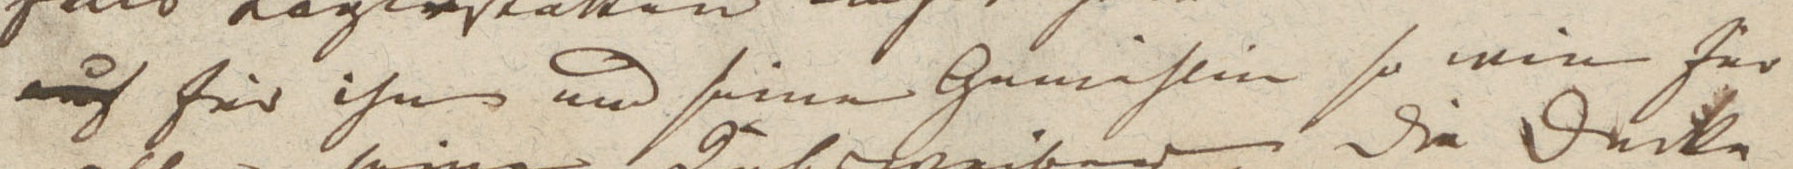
auf für ihn und seine Gemahlin so wie für
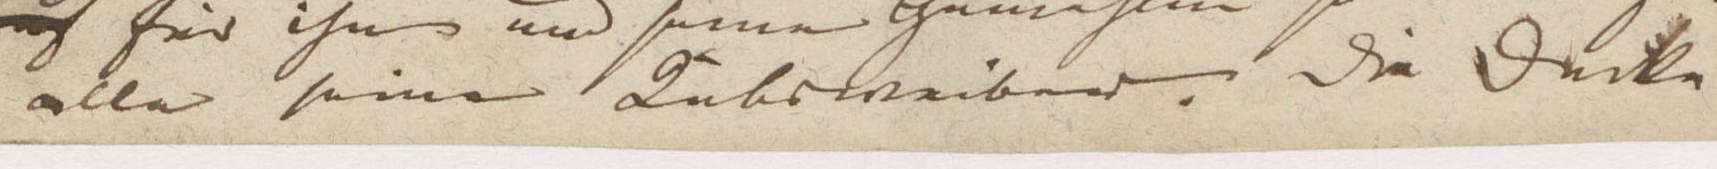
alle seine Kebsweiber. Die Decke
